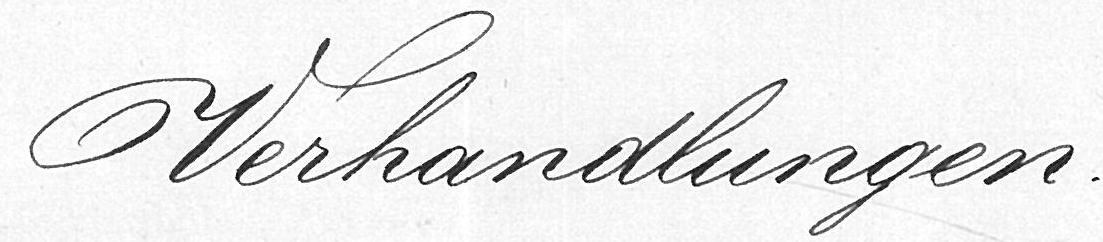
Verhandlungen
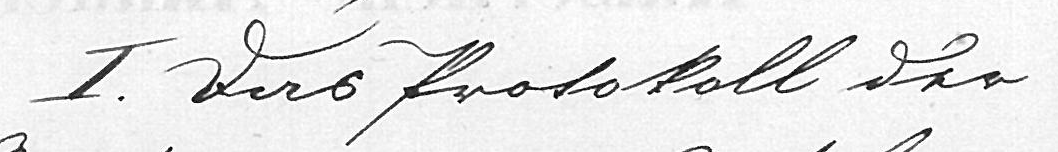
I. Das Protokoll der
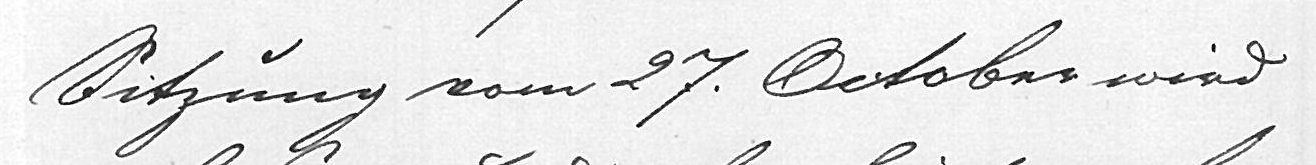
Sitzung von 27. October wird
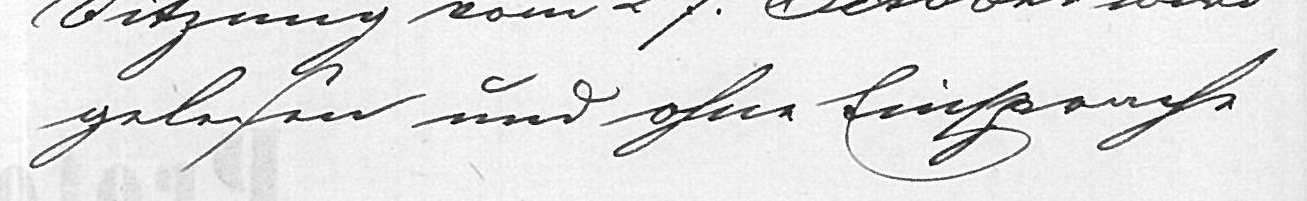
gelesen und ohne Einspruch
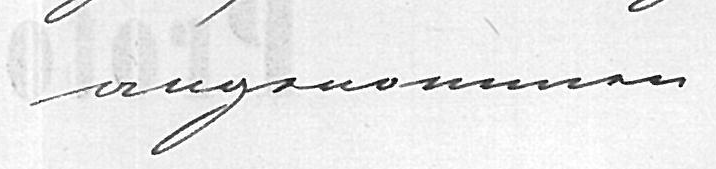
angenommen.
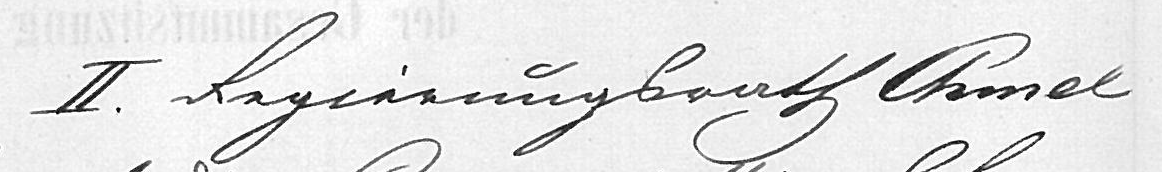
II. Regierungsrath Chmel
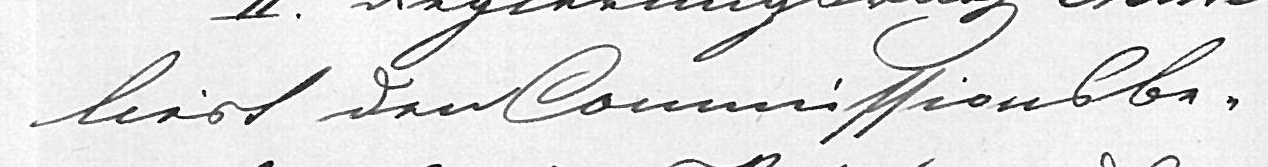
liest den Commissionsbe-
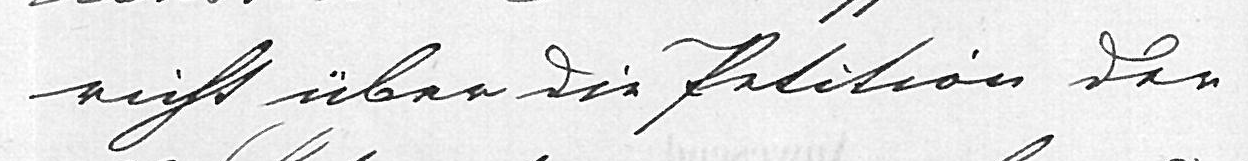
richt über die Petition der
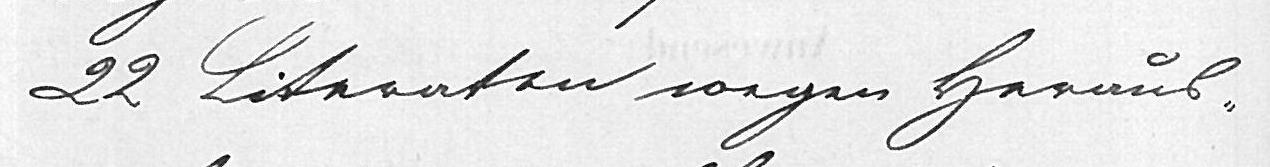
22 Literaten wegen Heraus-
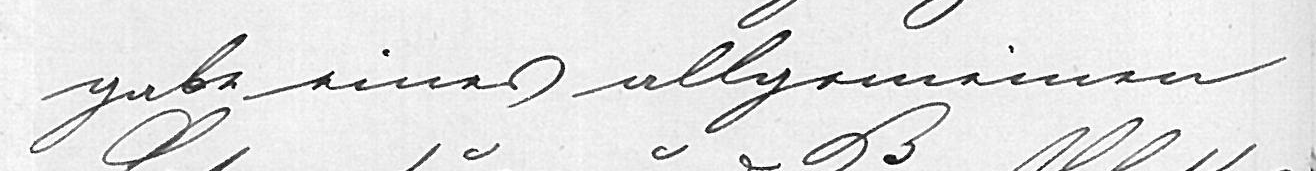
gabe eines allgemeinen
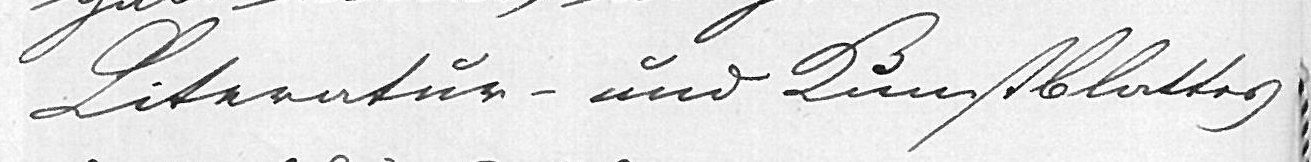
Literatur- und Kunstblattes
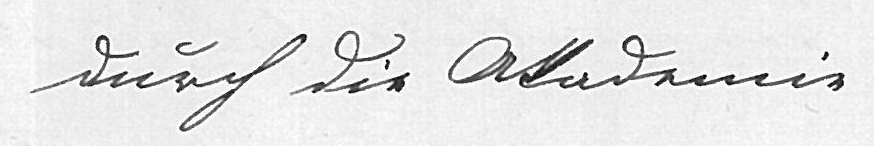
durch die Akademie
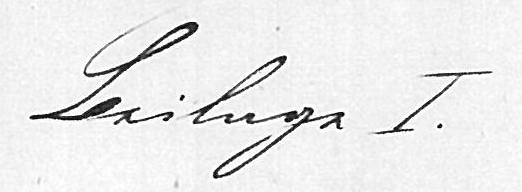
Beilage I.
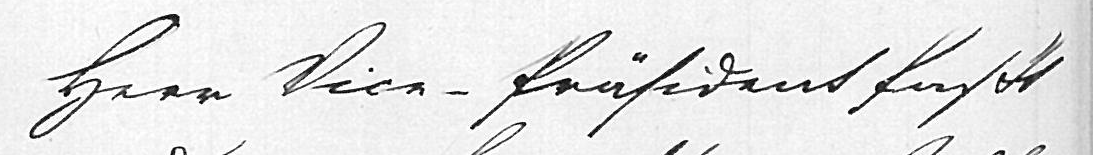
Herr Vice-Präsident faßt
